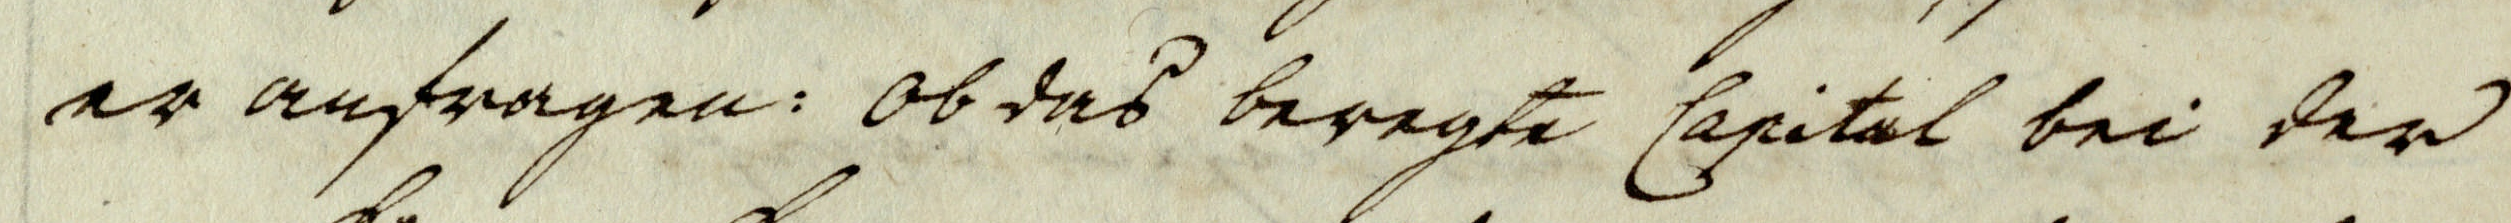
er anfragen: Ob das berechte Capital bei der
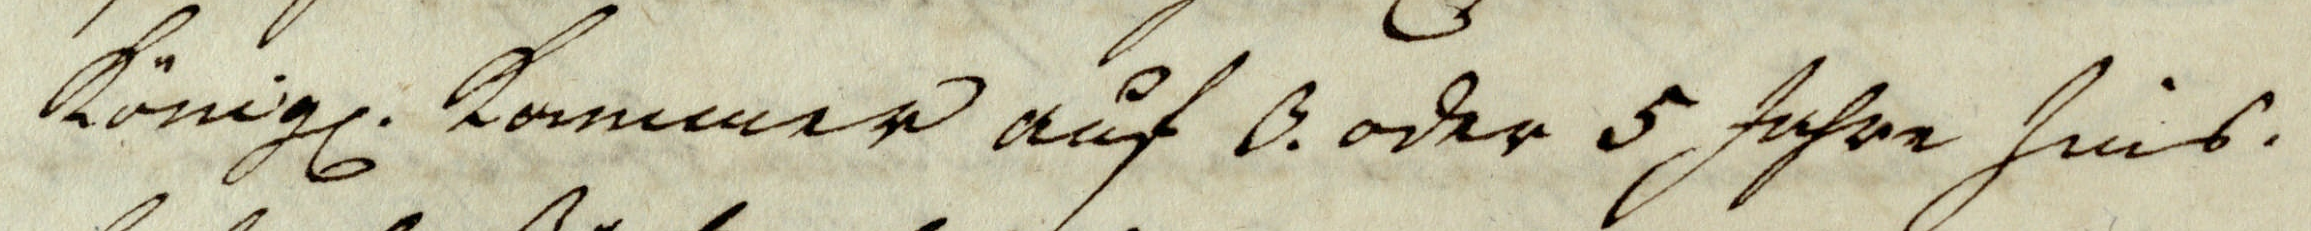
Königl. Kammer auf 3. oder 5 Jahre zins¬
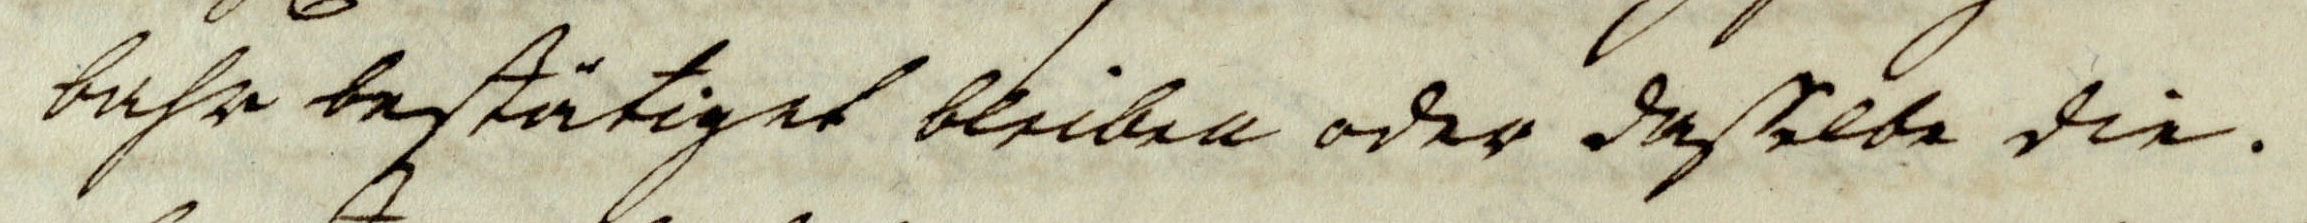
bahr bestätiget bleiben oder dasselbe die¬
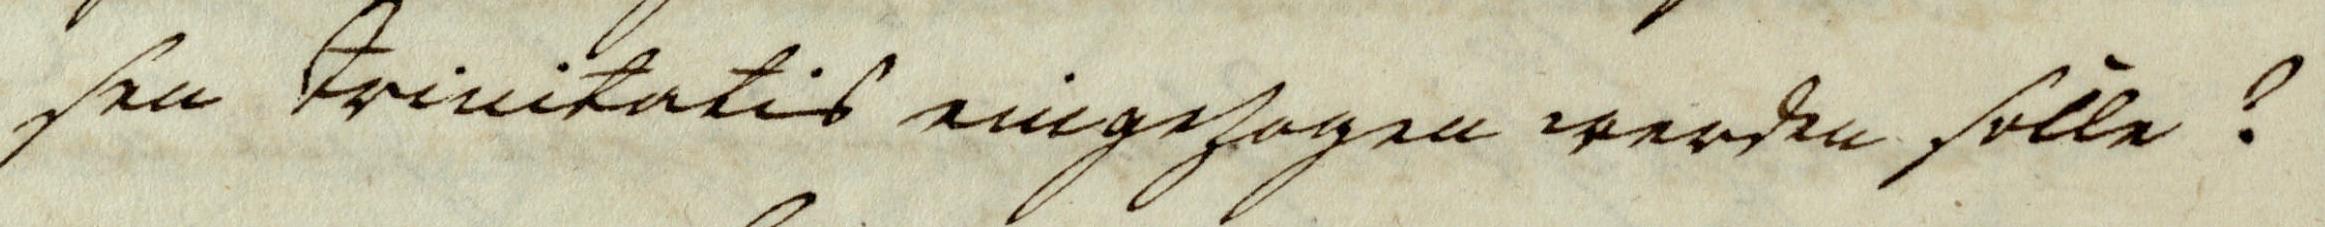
sen Trinitatis eingezogen werden solle?
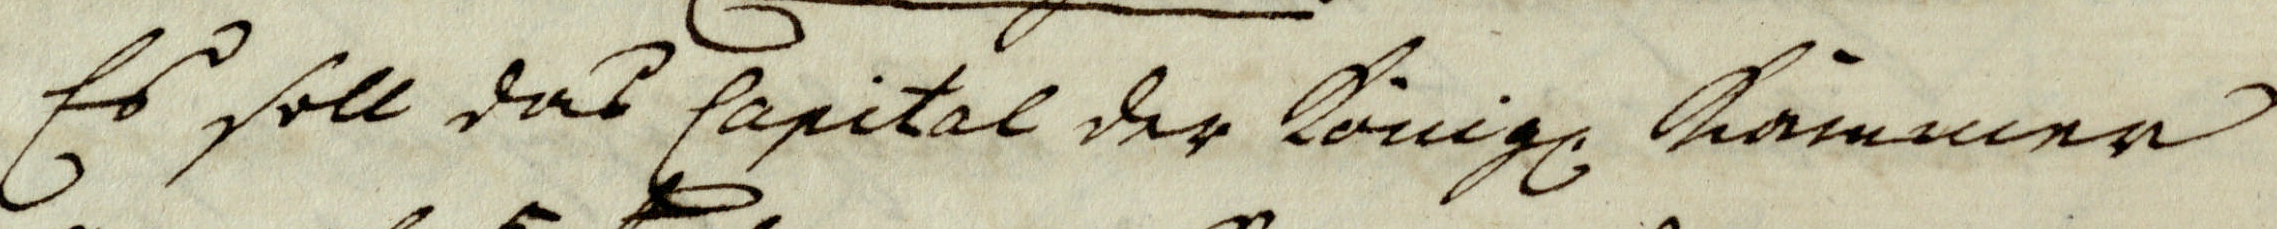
Es soll das Capital der Königl. Kammer
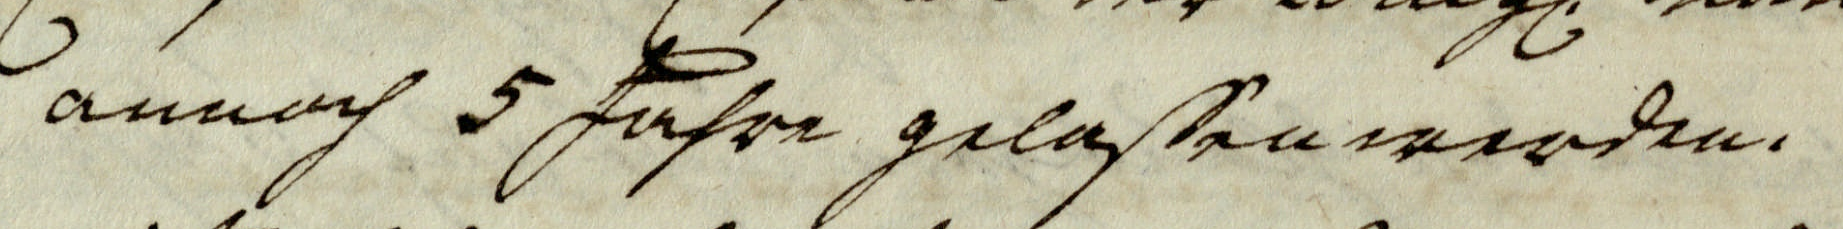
annoch 5 Jahre gelassen werden.
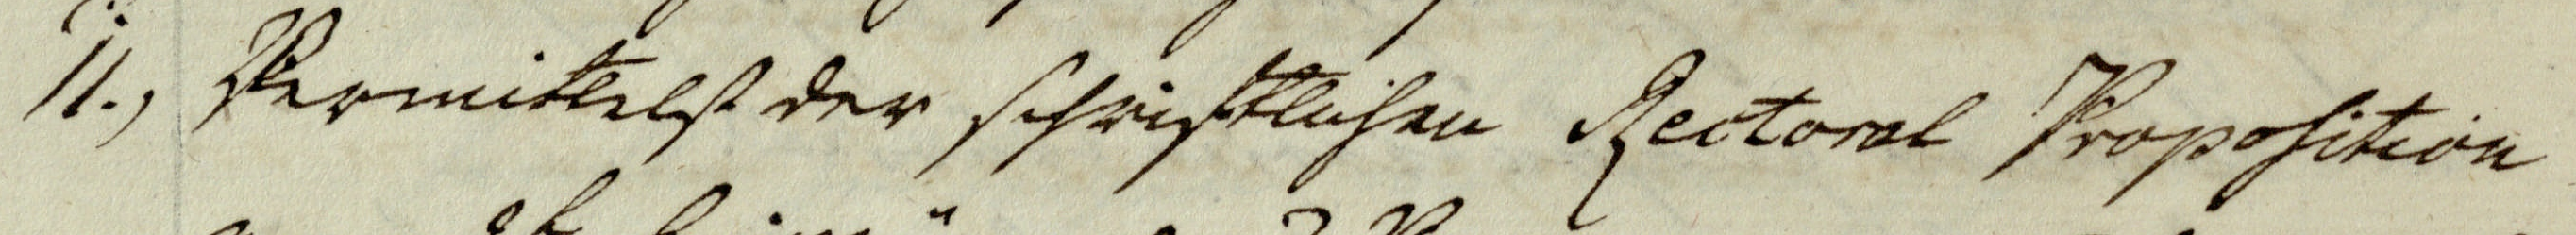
11., Vermittelß der schriftlichen Rectoral Proposition
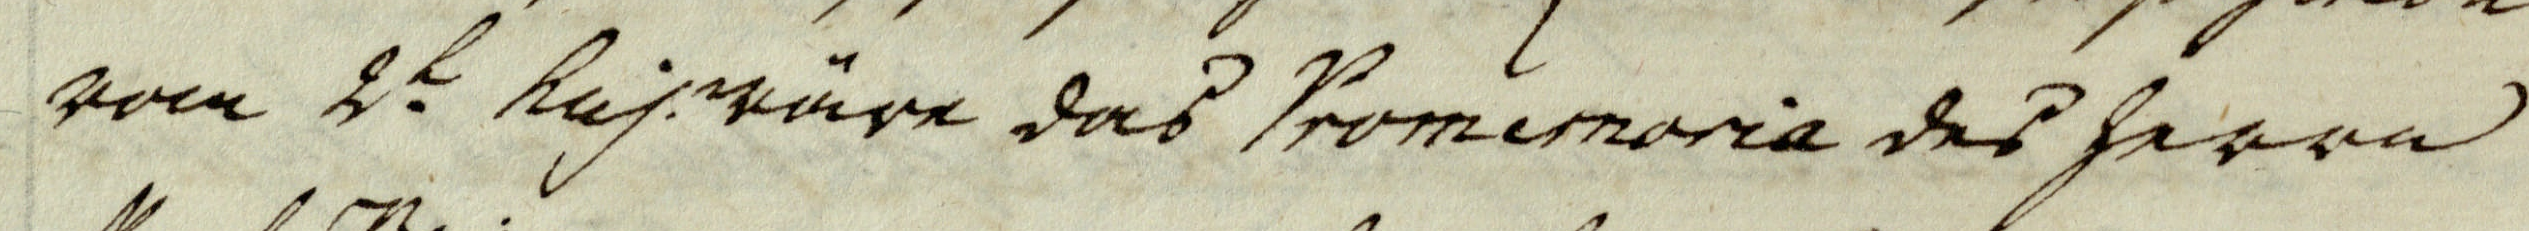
vom 2t. huj. wäre das Promemoria des Herrn
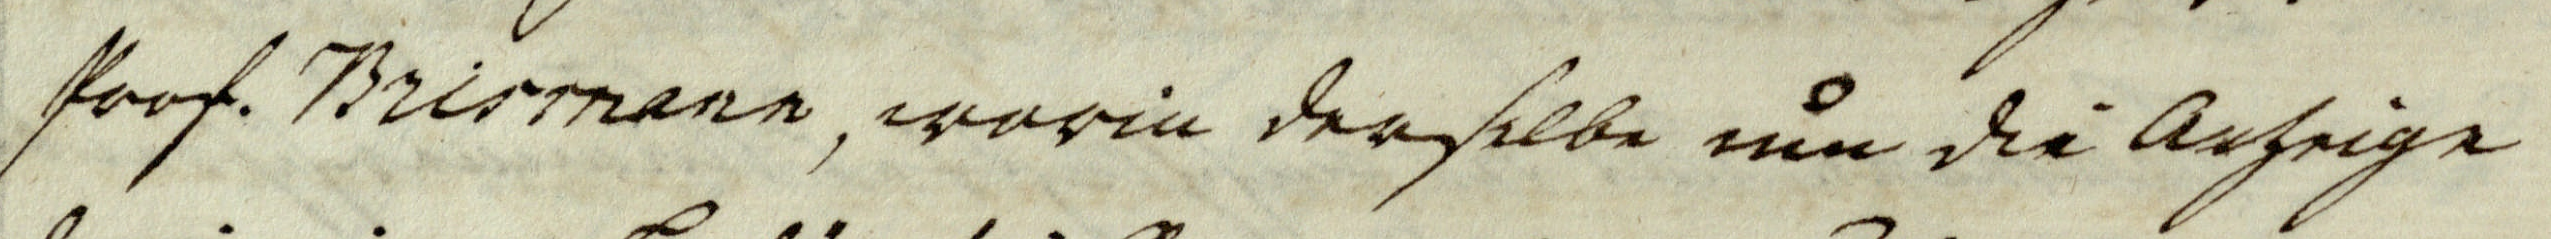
Prof. Brismann, worin derselbe um die Anzeige
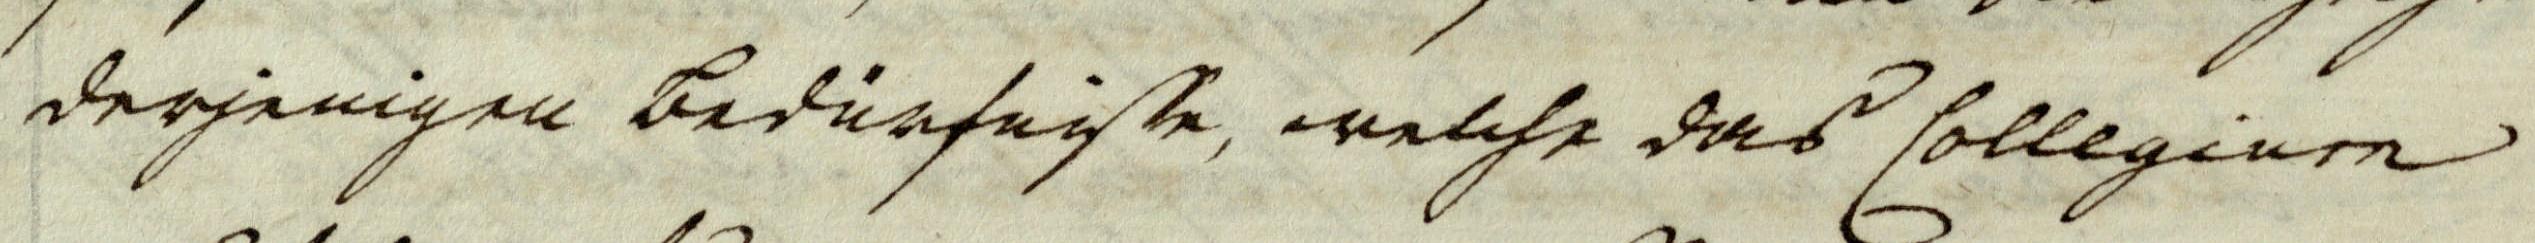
derjenigen Bedürfnisse, welche das Collegium
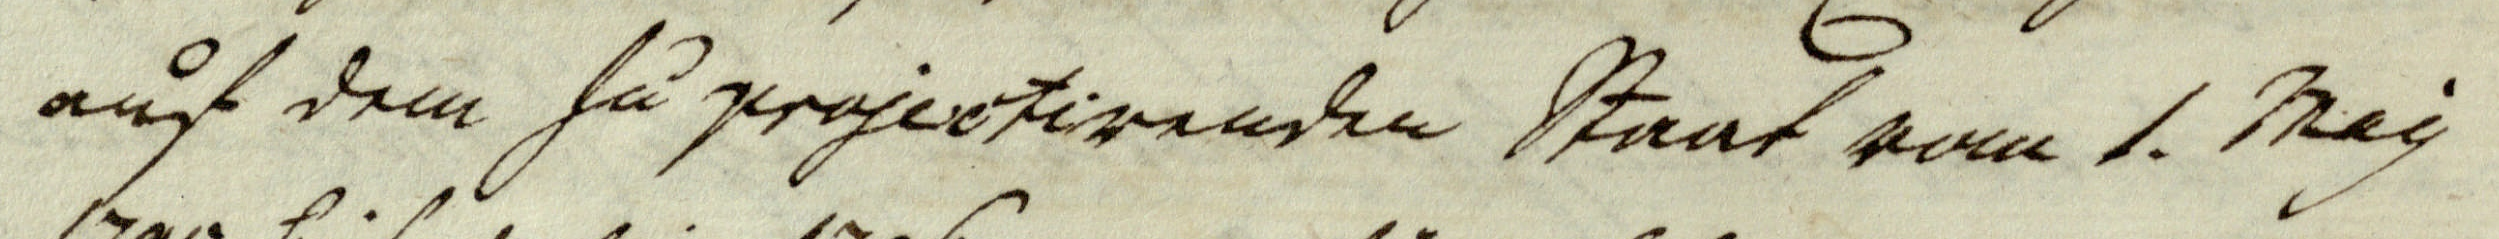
auf dem zu projectirenden Staat vom 1. Maÿ
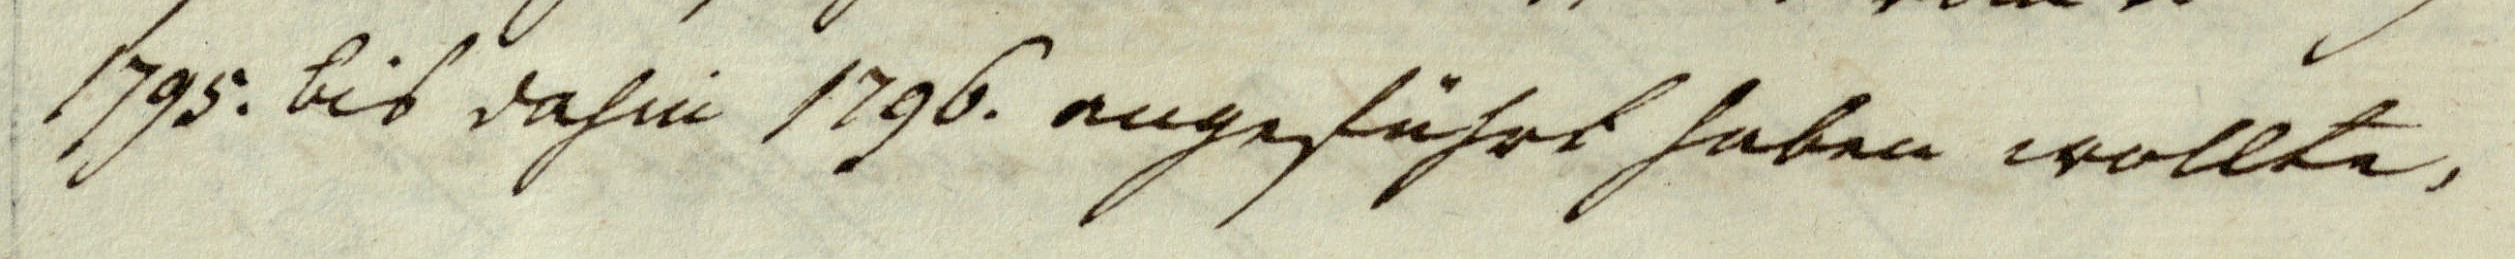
1795. bis dahin 1796. angeführt haben wollte,
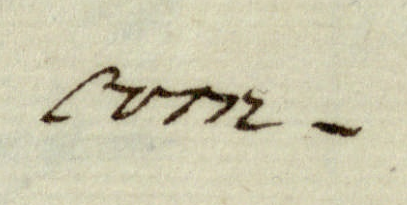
com¬
